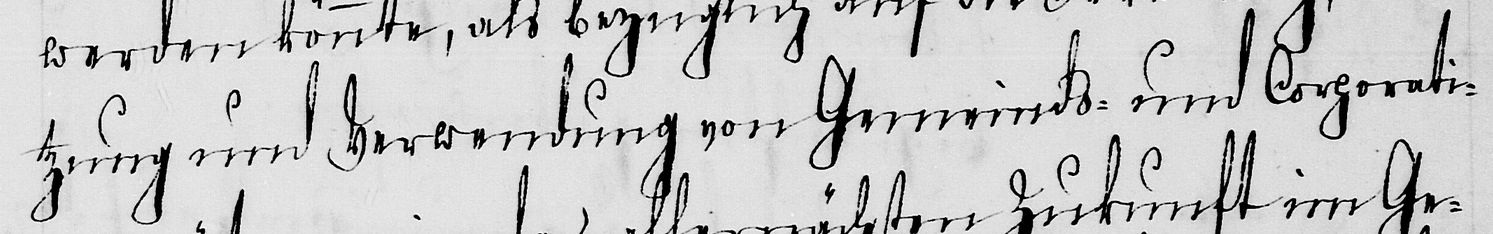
tzung und Verwendung von Gemeinds- und Corporati¬
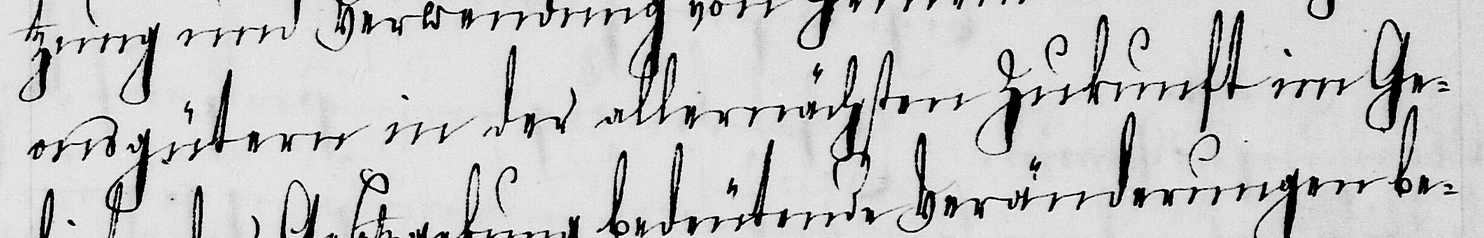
onsgütern in der allernächsten Zukunft im Ge¬
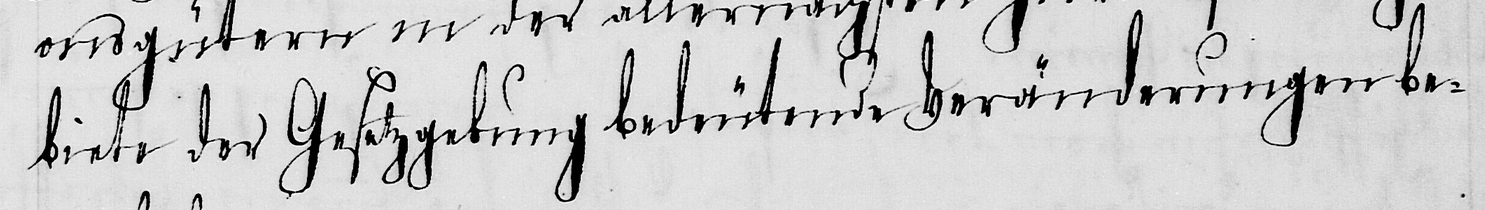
biete der Gesetzgebung bedeutende Veränderungen be¬
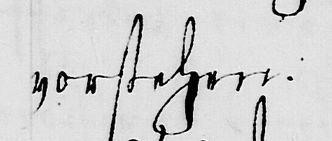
vorstehen.
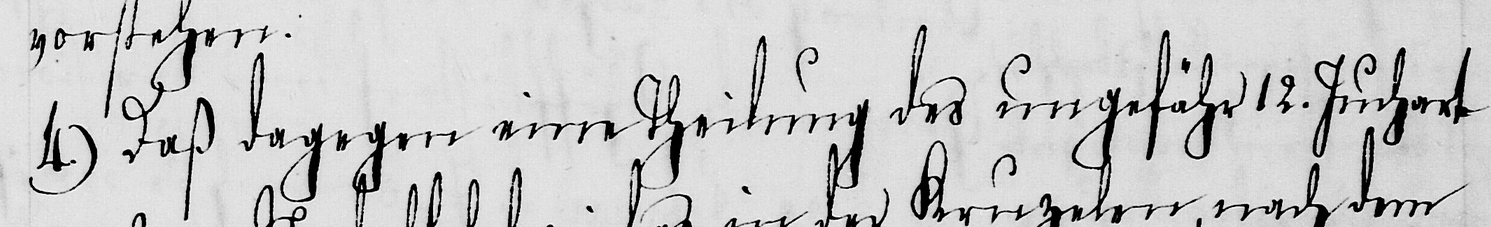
4.) Daß dagegen eine Theilung des ungefähr 12. Juchart
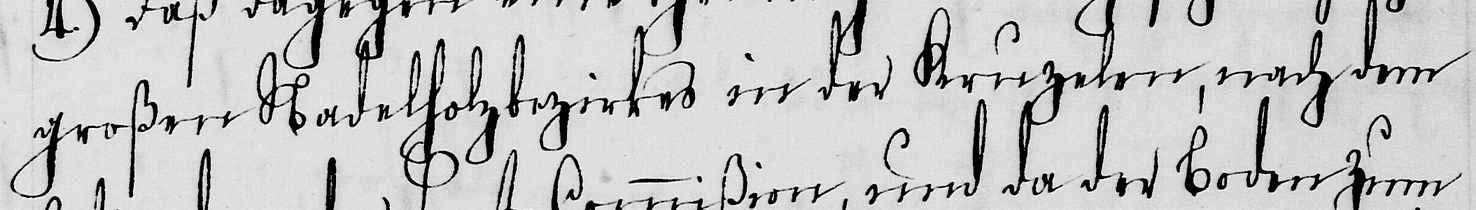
großen Nadelholzbezirkes in der Kruzelen, nach dem
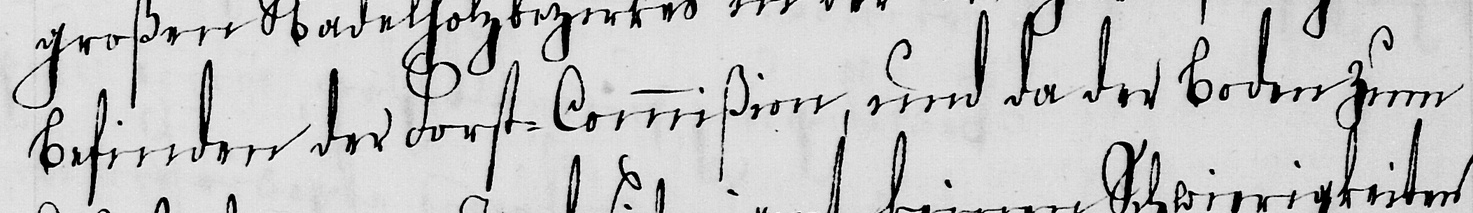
Befinden der Forst-Commißion, und da der Boden zum
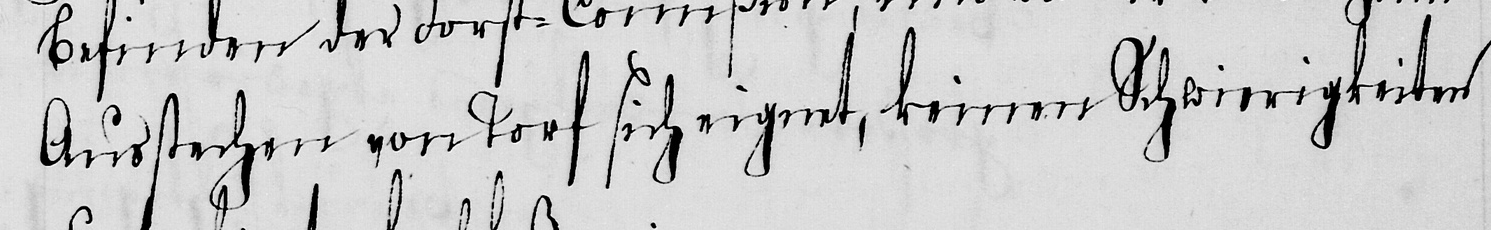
Ausstechen von Torf sich eignet, keinen Schwierigkeiten
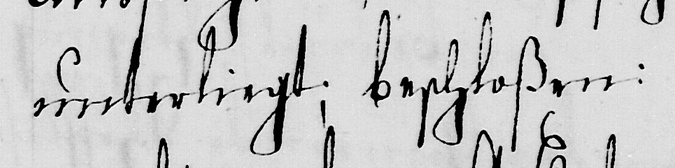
unterliegt; beschloßen:
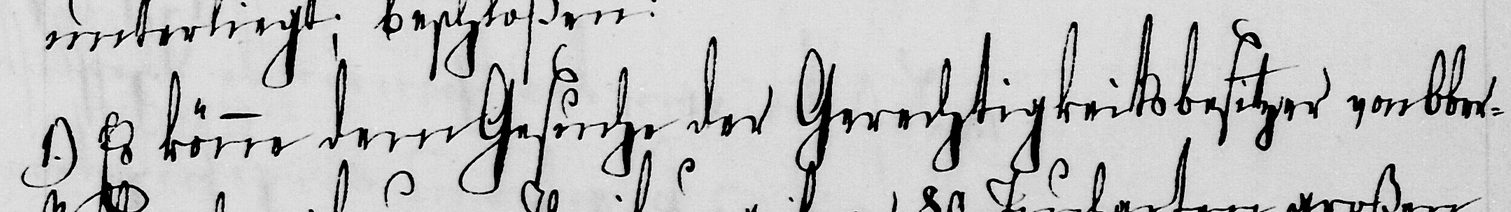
Es könne dem Gesuche der Gerechtigkeitsbesitzer von Ob¬
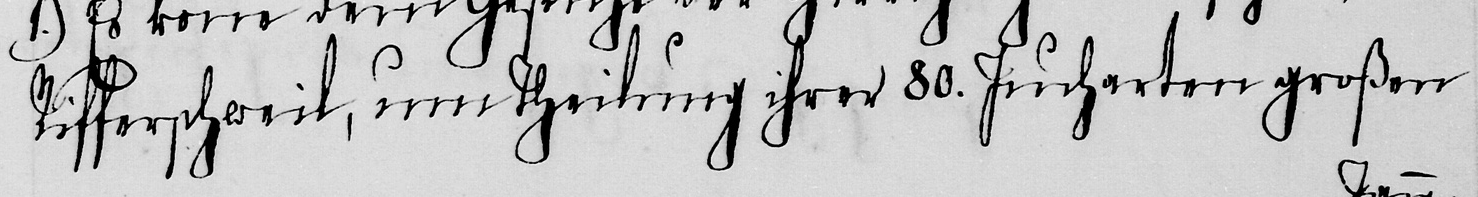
ifferschweil, um Theilung ihrer 80. Jucharten großen
